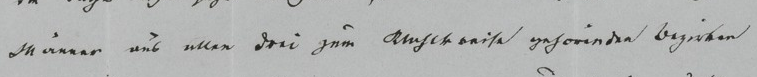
Männer aus allen drei zum Wahlkreise gehörenden Bezirken
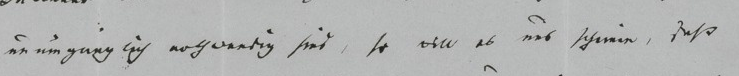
unumgänglich nothwendig sind, so will es uns scheinen, daß
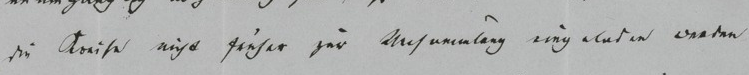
die Kreise nicht früher zur Versammlung eingeladen werden
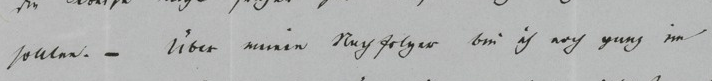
sollten. – Über meinen Nachfolger bin ich noch ganz im
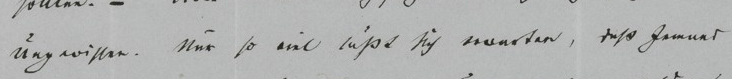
Ungewissen. Nur so viel läßt sich erwarten, daß Jemand
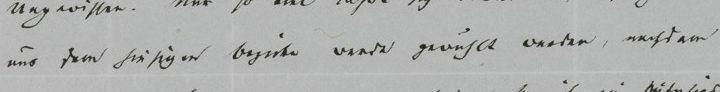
aus dem hiesigen Bezirke werde gewählt werden, nachdem
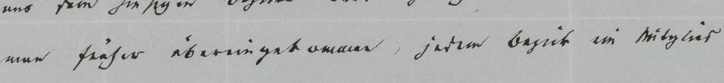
man früher übereingekommen, jedem Bezirk ein Mitglied
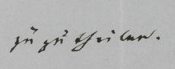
zuzutheilen.
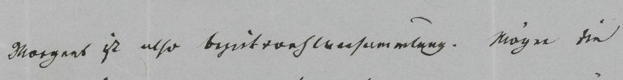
Morgens ist also Bezirkswahlversammlung. Mögen die
